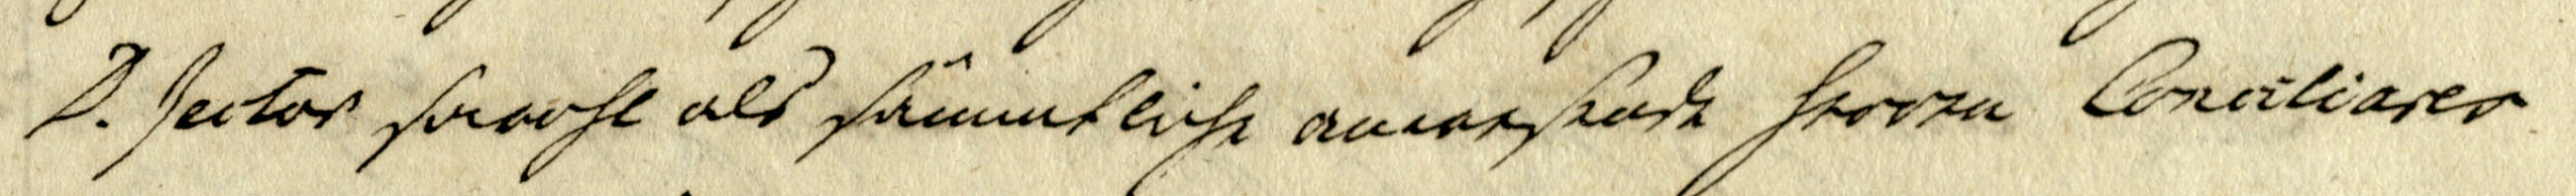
D. Rector sowohl als sämmtliche anwesende herren Conciliares
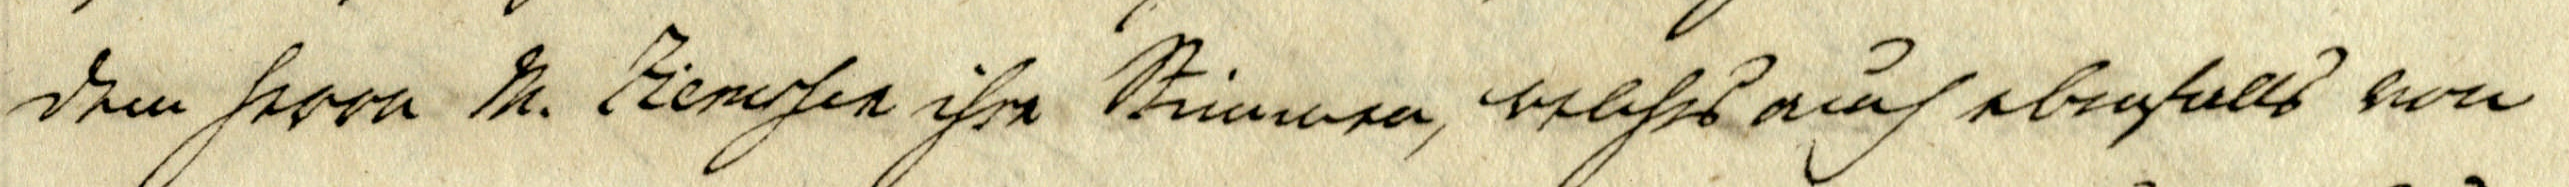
dem herrn M. Ziemssen ihre Stimmen, welches auch ebenfalls von
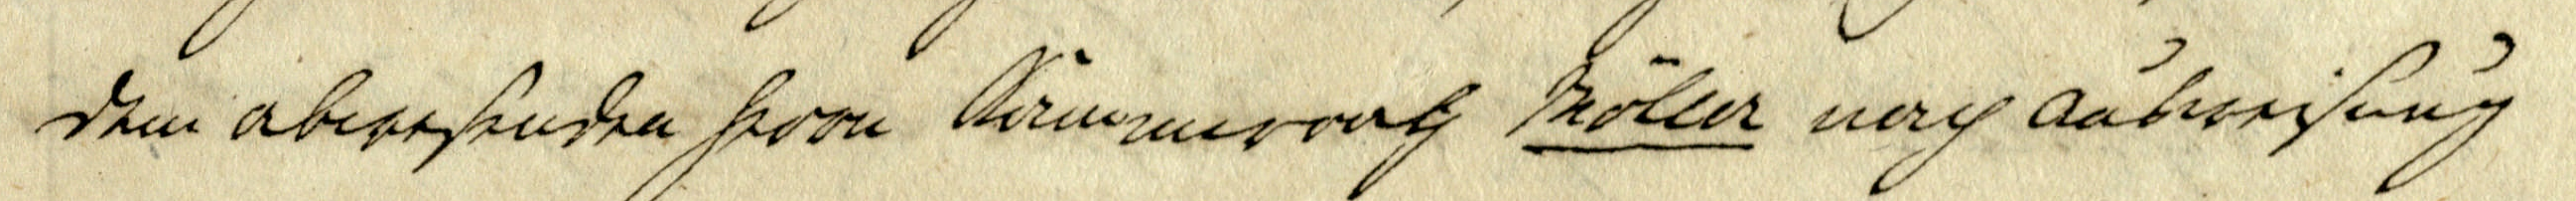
dem abwesenden herrn Kammerrath Möller nach Ausweisung
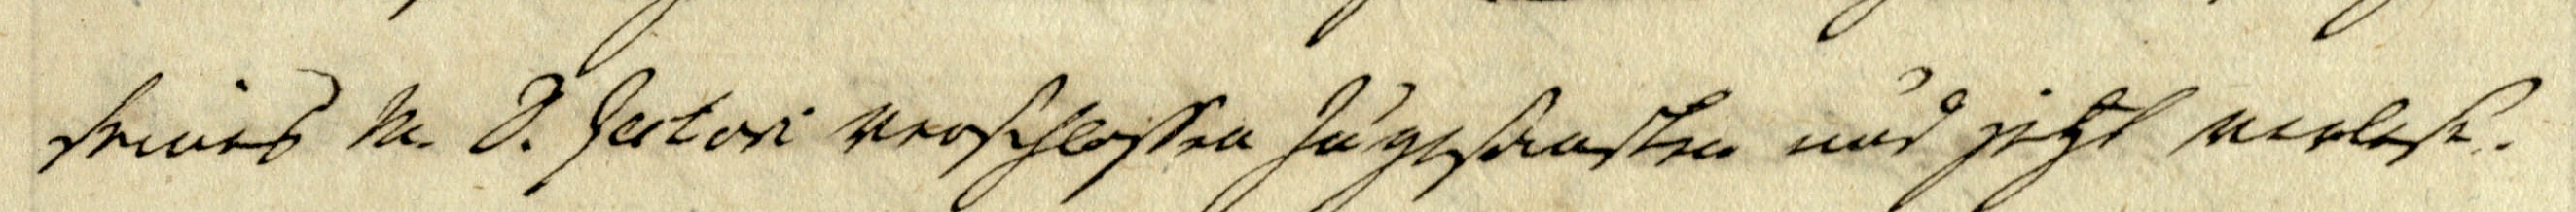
seines M. D. Rector verschlossen zugesandten und jetzt verlese¬
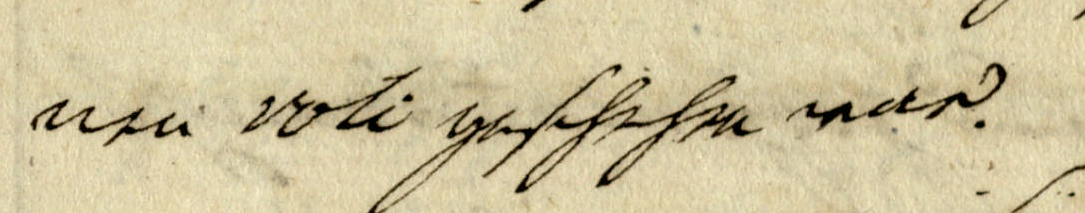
nen voti geschehen war.
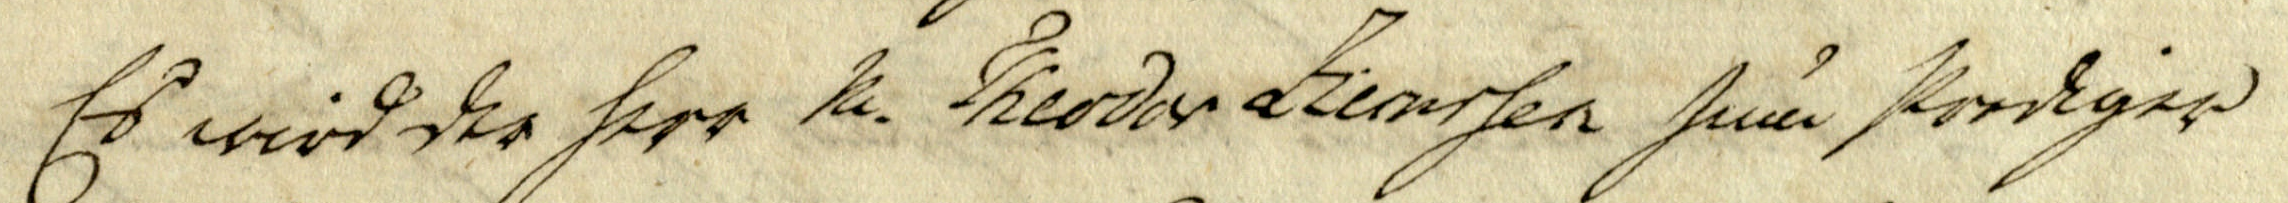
Es wird der herr M. Theodor Ziemssen zum Prediger
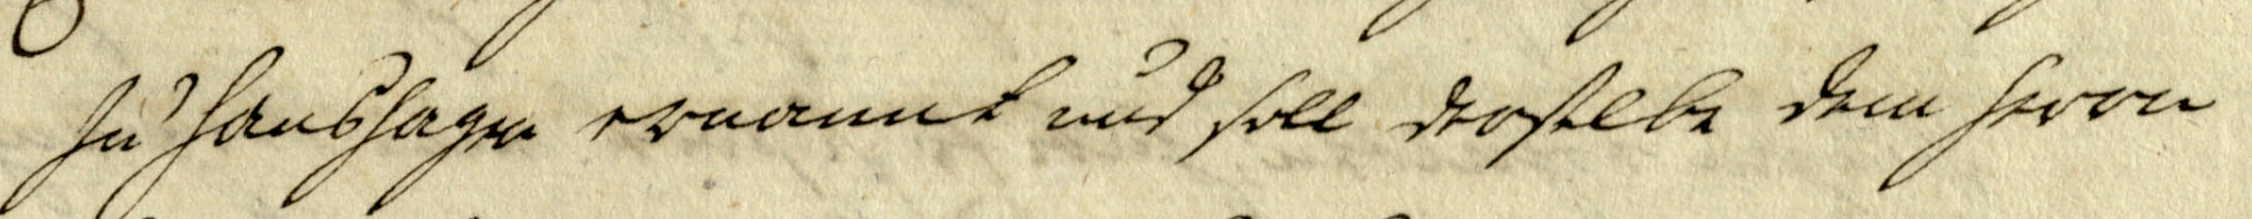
zu hanshagen ernannt und soll derselbe dem herrn
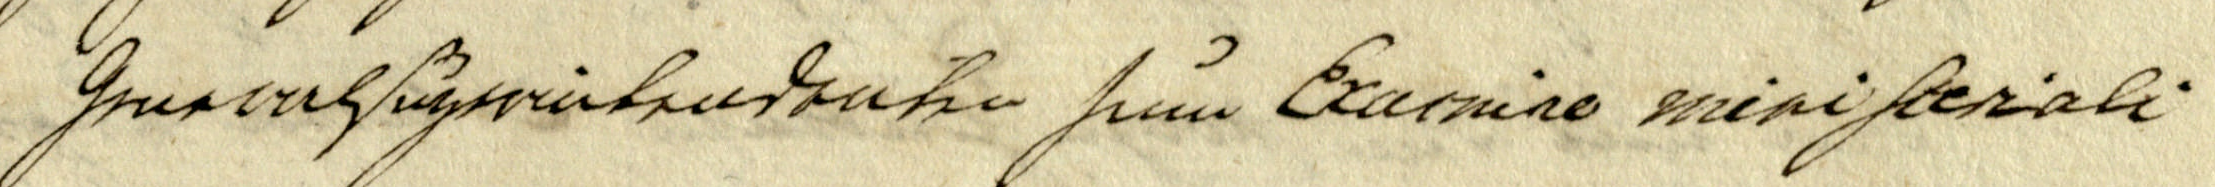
Generalsuperintendenten zum Examino ministeriali
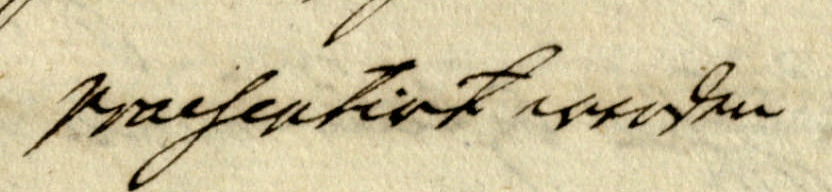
praesentirt werden.
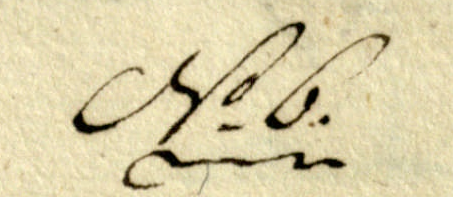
Nº 6.
